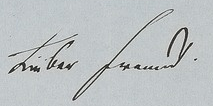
Lieber Freund.
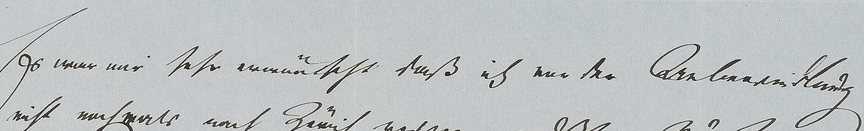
Es war mir sehr erwünscht daß ich vor der Uebersiedlung
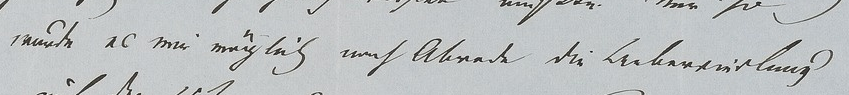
wurde es mir möglich nach Abrede die Uebersiedlung
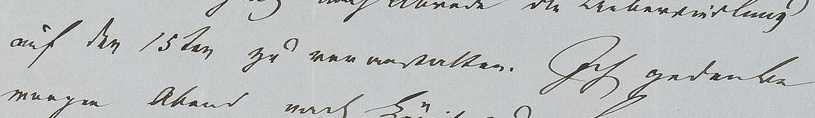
auf den 15ten zu veranstalten. Ich gedenke
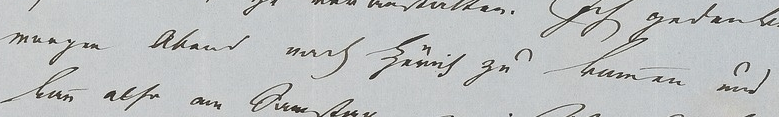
morgen Abend nach Zürich zu kommen und
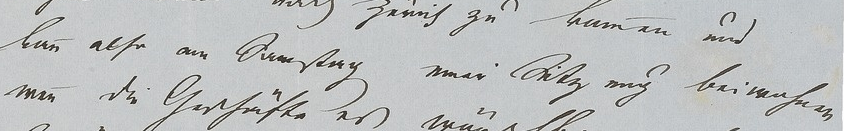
kann also am Samstag einer Sitzung beiwohnen
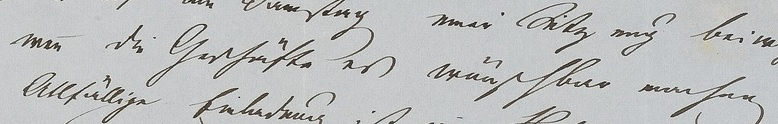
wenn die Geschäfte es wünschbar machen.
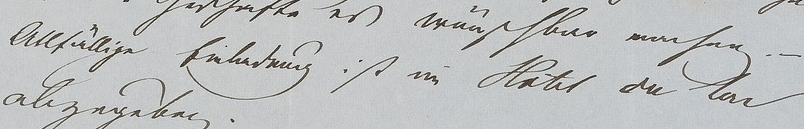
Allfällige Einladung ist im Hotel du Lac
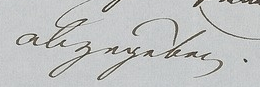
abzugeben.
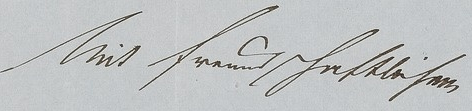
Mit freundschaftlichem
